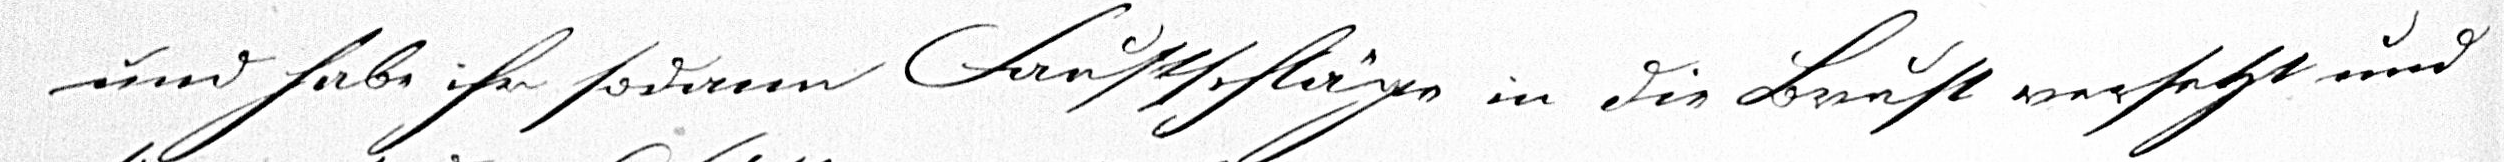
und habe ihr sodann Faustschläge in die Brust versetzt und
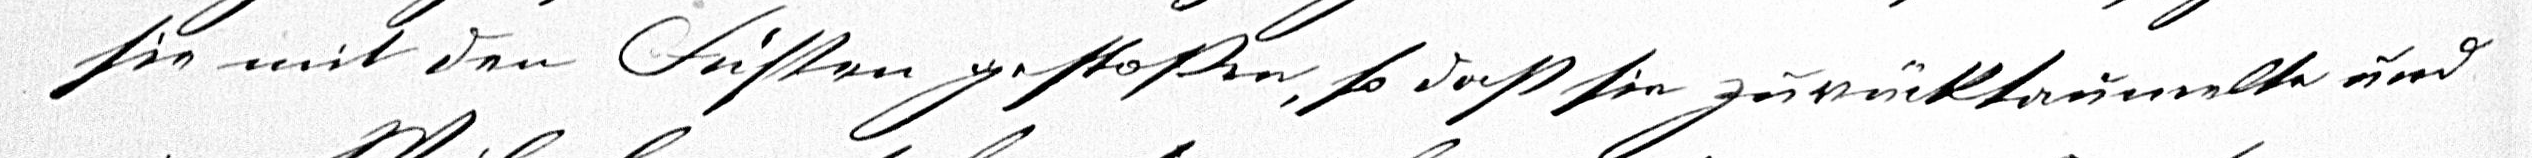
sie mit den Füßen gestoßen, so daß sie zurücktaumelte und
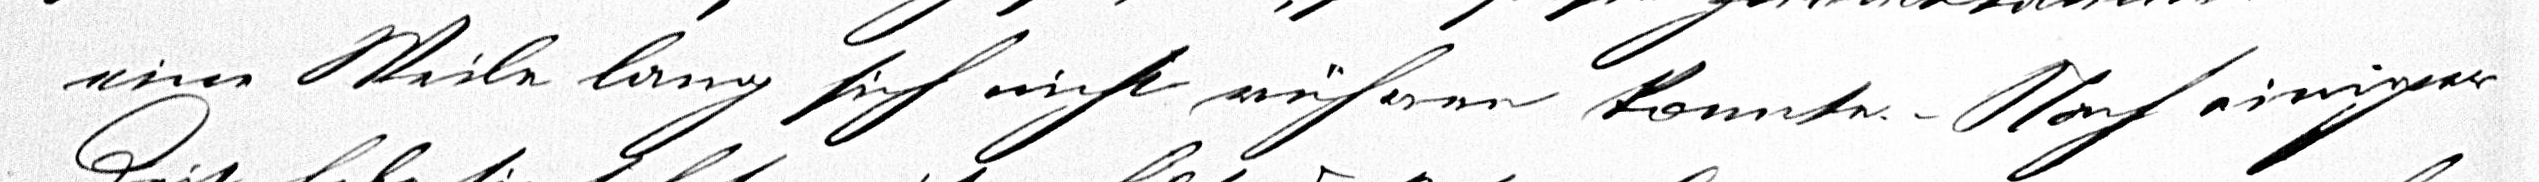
eine Weile lang sich nicht rühren konnte. - Nach einiger
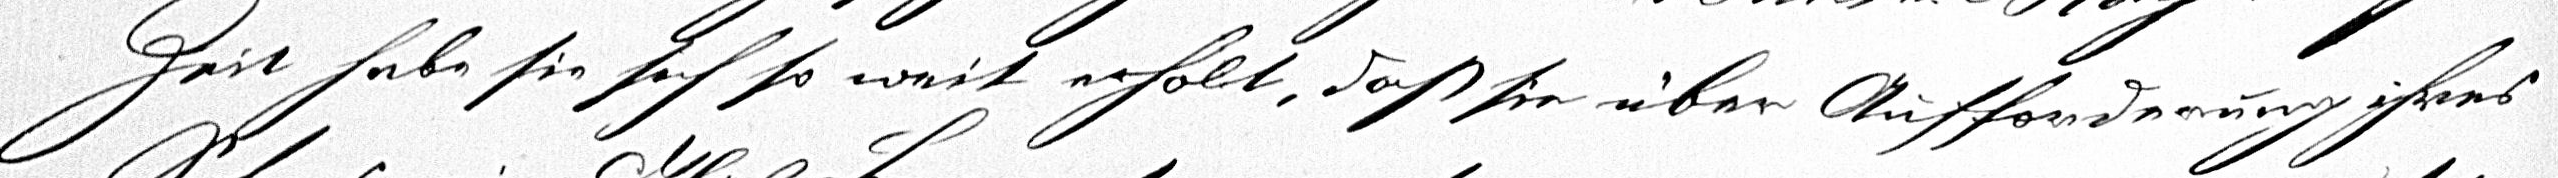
Zeit habe sie sich so weit erholt, daß sie über Aufforderung ihres
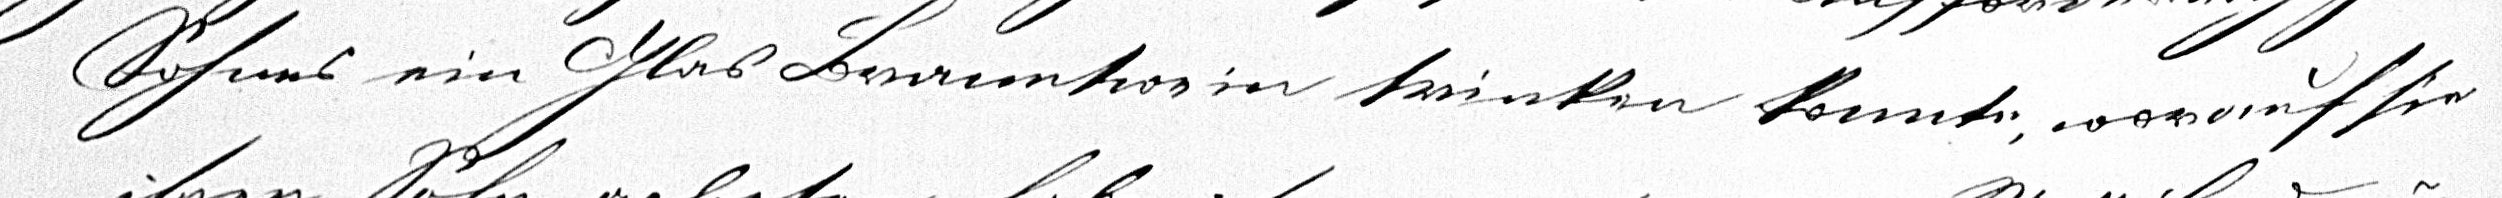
Sohnes ein Glas Branntwein trinken konnte, worauf sie
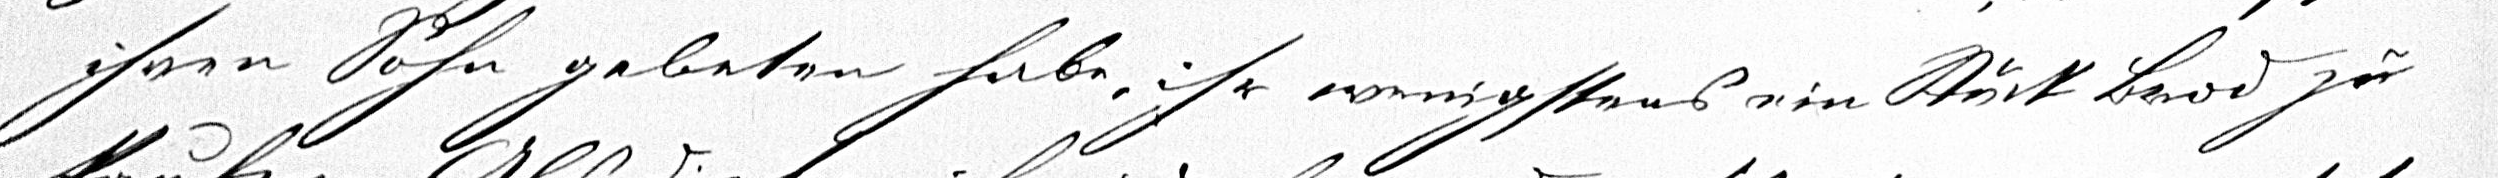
ihren Sohn gebeten habe, ihr wenigstens ein Stuck Brod zu
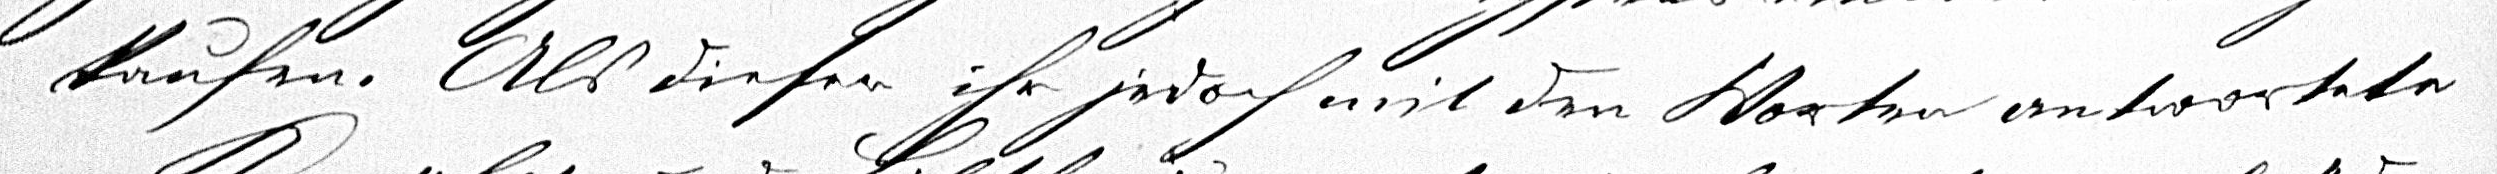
kaufen. Als dieser ihr jedoch mit den Worter antwortete
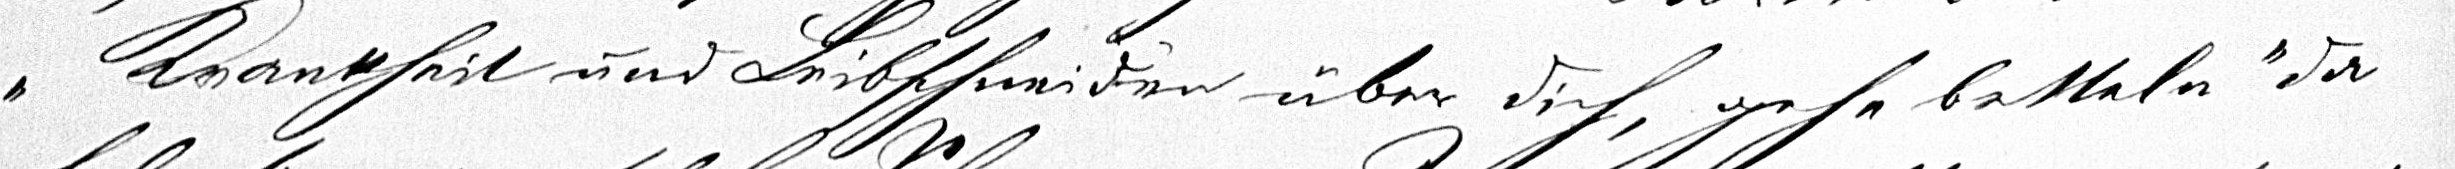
„Krankheit und Leibschneiden über dich, gehe bettele" da
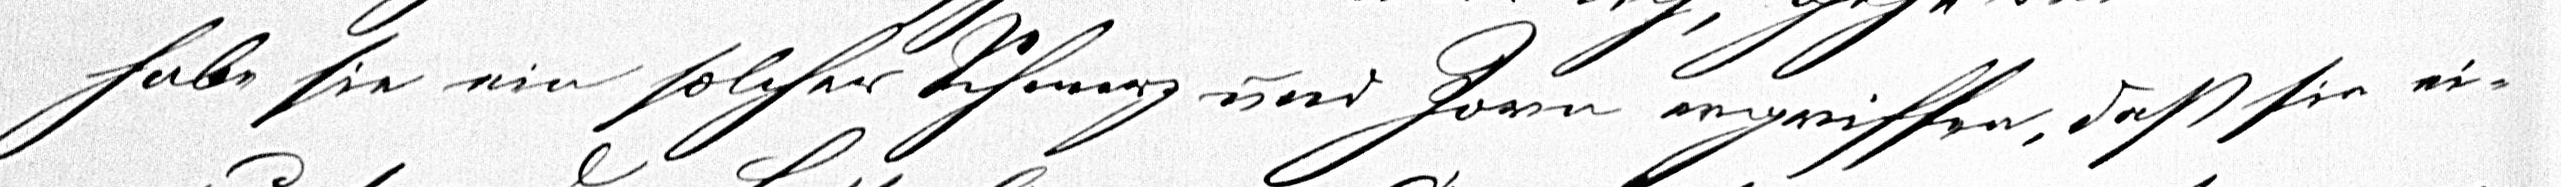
habe sie ein solcher Schmerz und Jove ergriffen, daß sie ei¬
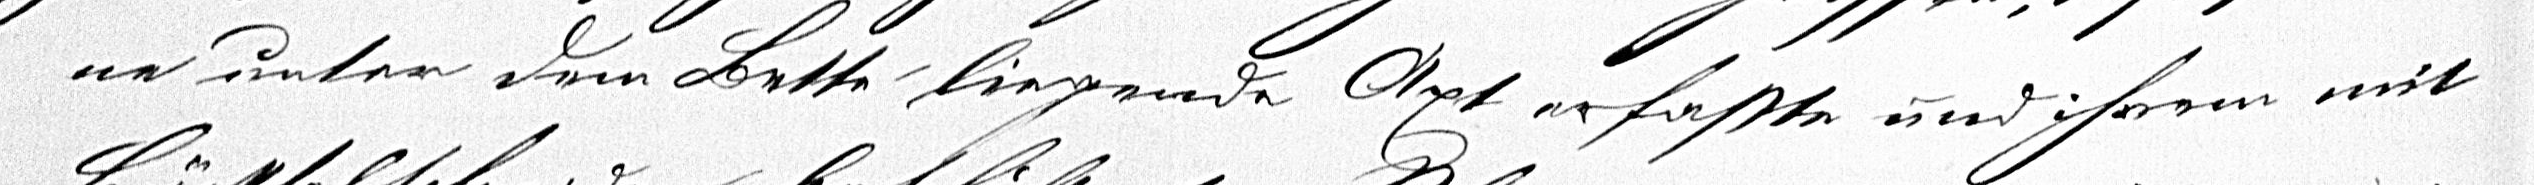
ne unter dem Bette liegende Axt erfaßte und ihrem mit
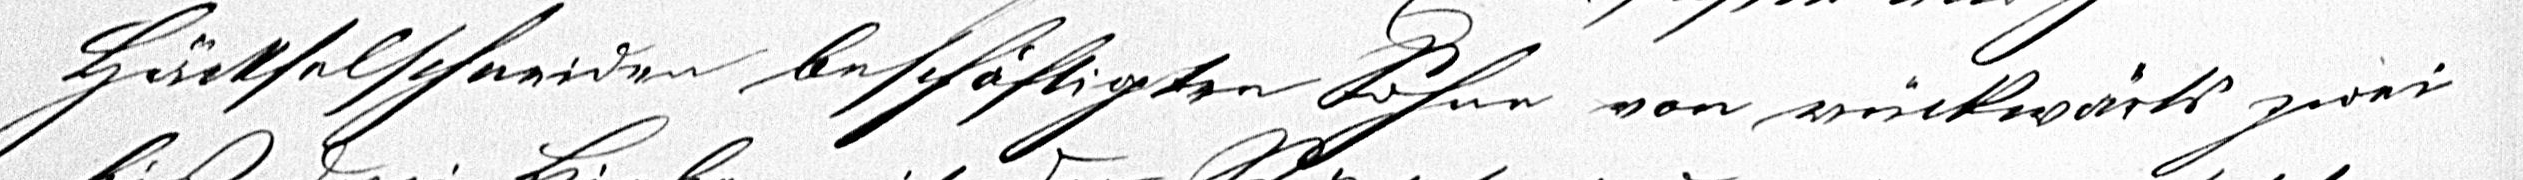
Häckselschneiden beschäftigten Sohne von rückwärts zwei
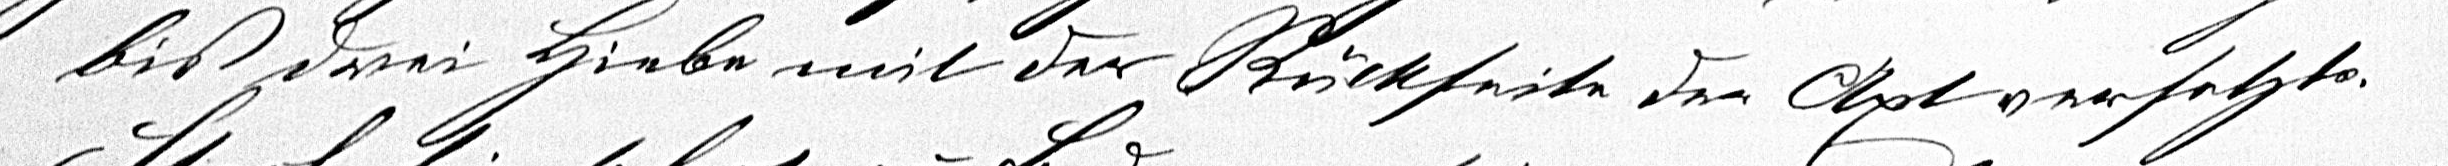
bis drei Hiebe mit der Rückseite der Axt versetzte.
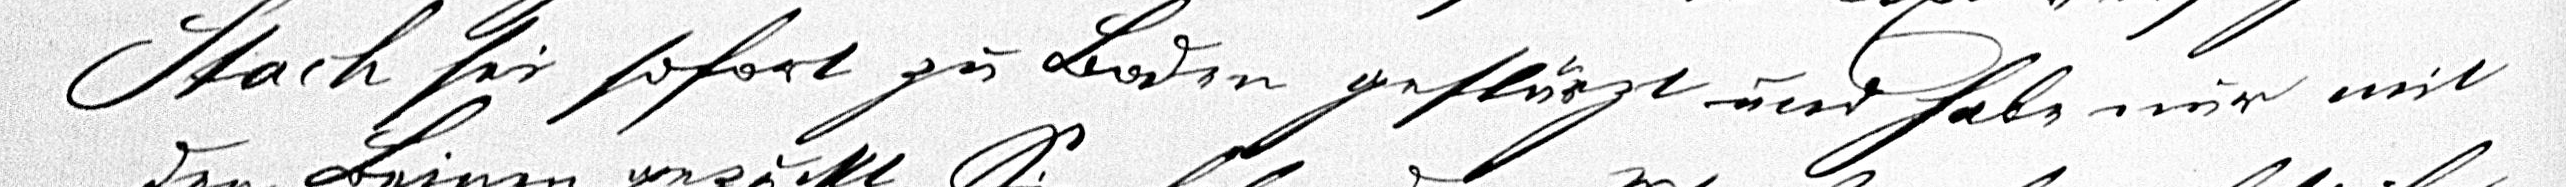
Stach sei sofort zu Boden gestürzt und habe nur mit
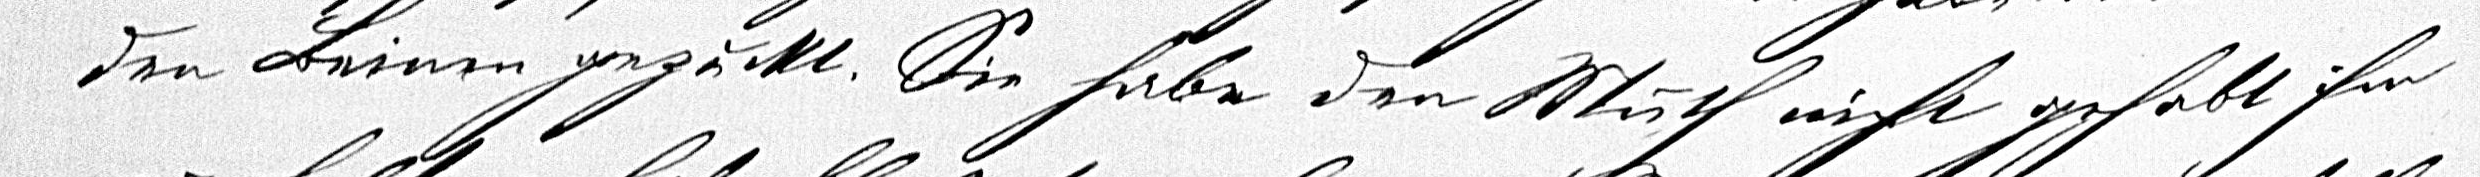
den Beinen gezuckt. Sie habe den Muth nicht gehabt ihm
